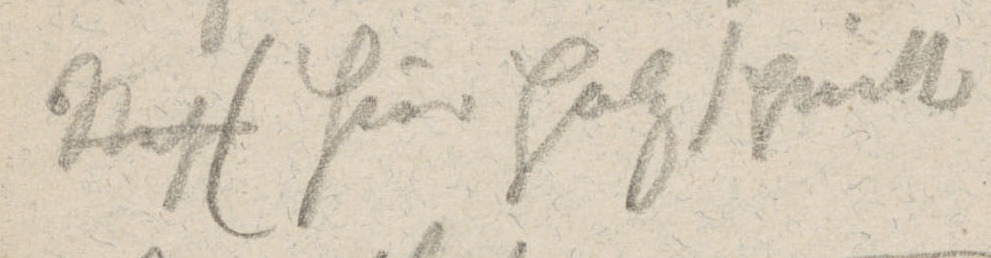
nichts sich nicht
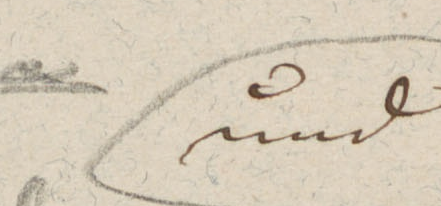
auf die
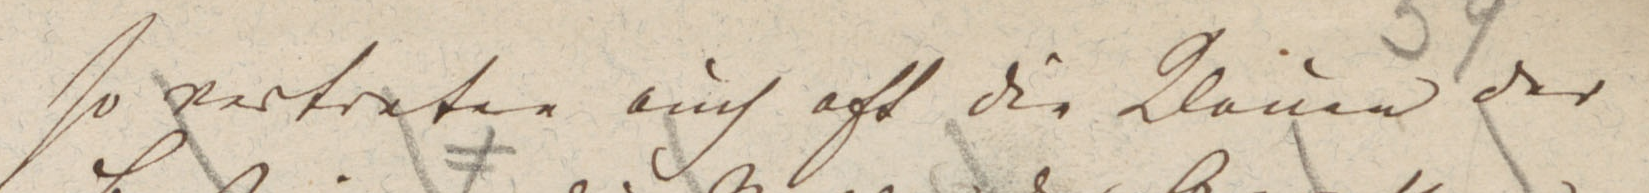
so vertreten auch oft die Klauen der
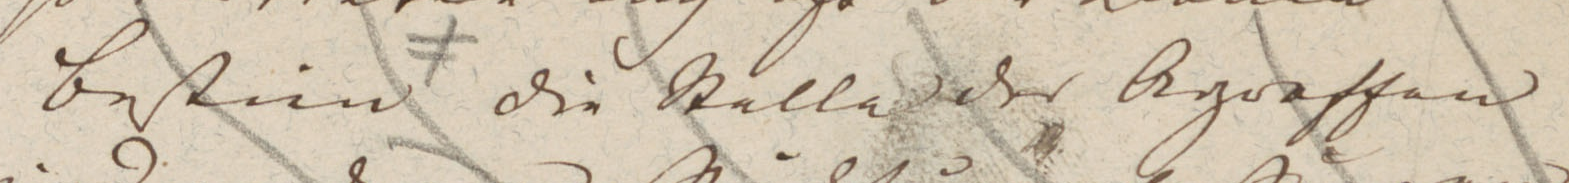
Bestien % die Stelle der Agraffen
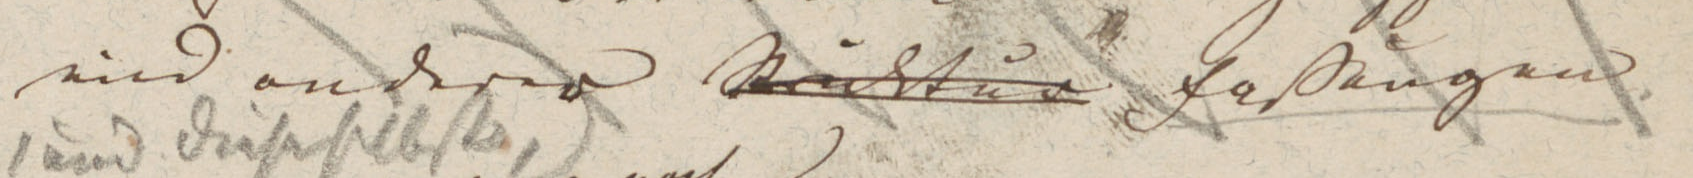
und anderer Struktur Fassungen
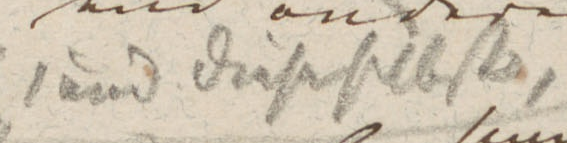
und dieseselbst,
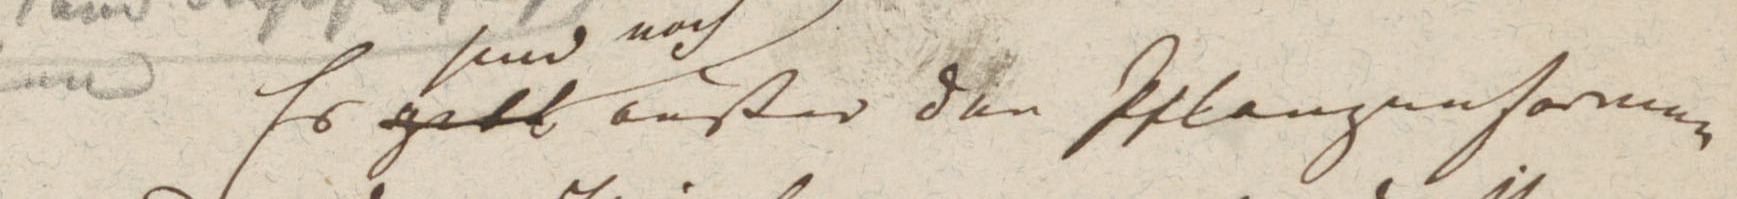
sind noch ausser den Pflanzenformen
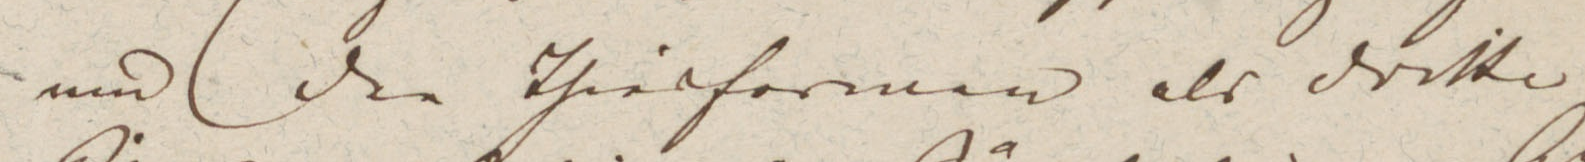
und den Thierformen als dritte
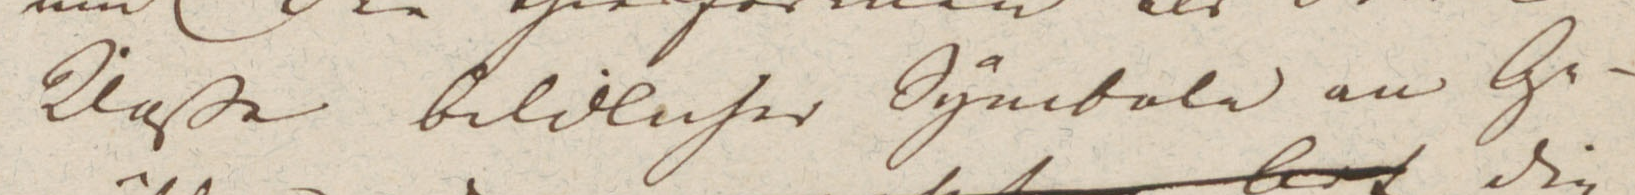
Klasse bildlicher Symbole an Ge-
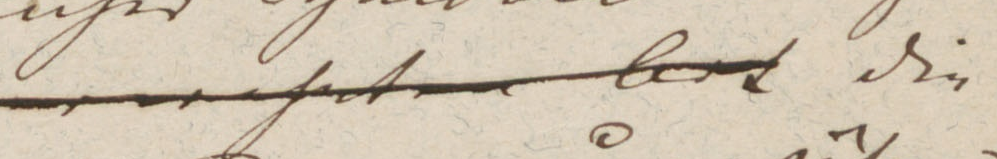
der erwahnten Art die
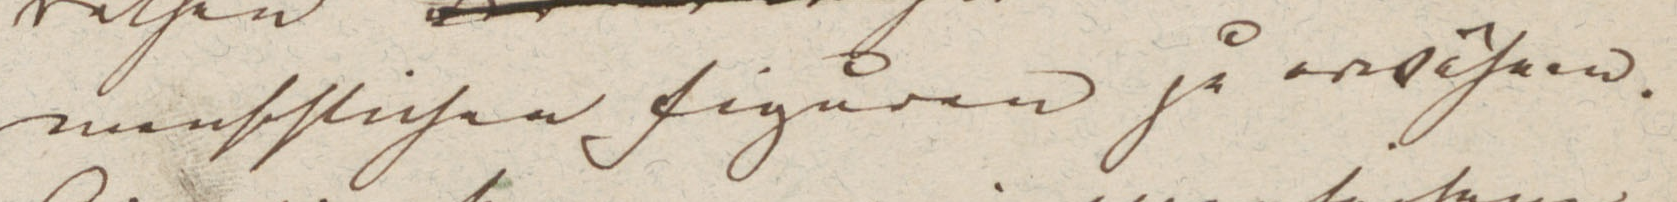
menschlichen Figuren zu erwähnen.
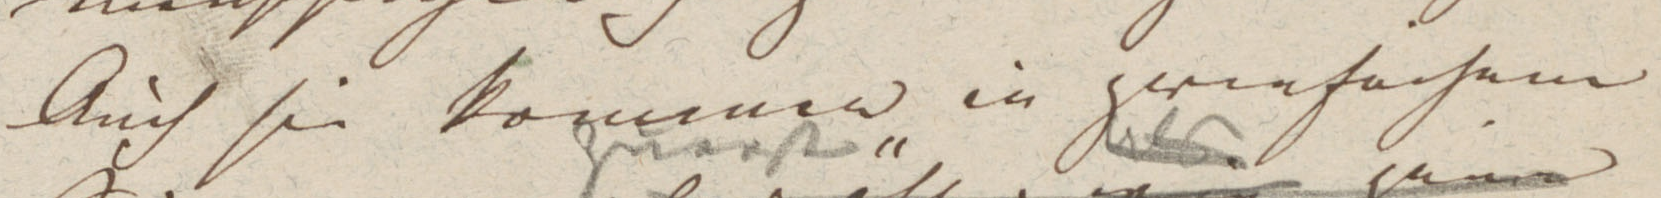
Auch sie kommen in zwiefachem
